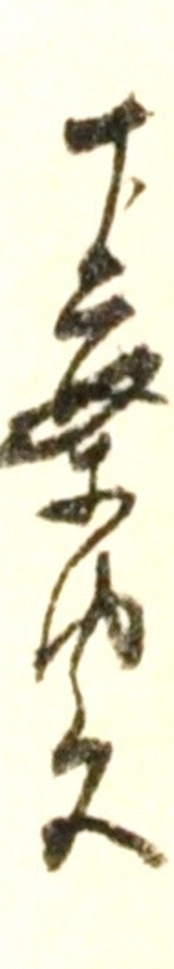下案内文
